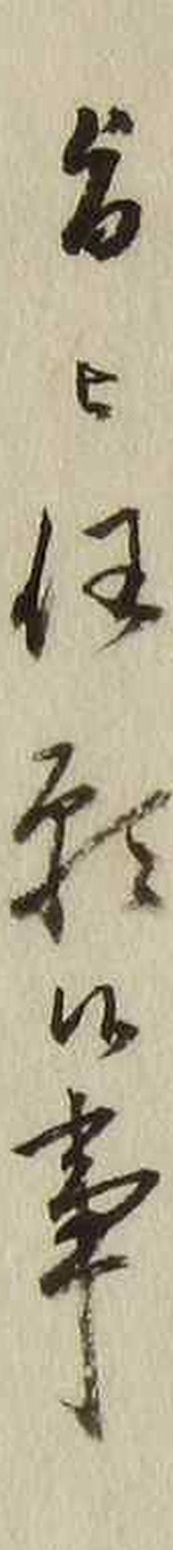旨被任願候事
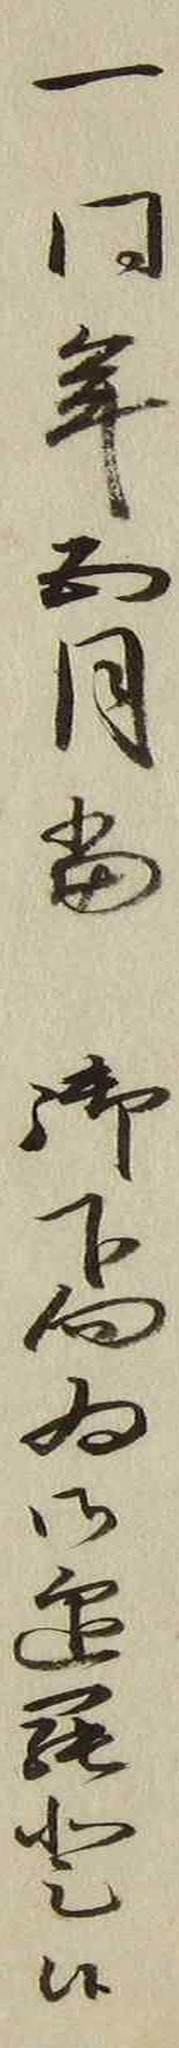一同年五月当御下向為御迎罷登候
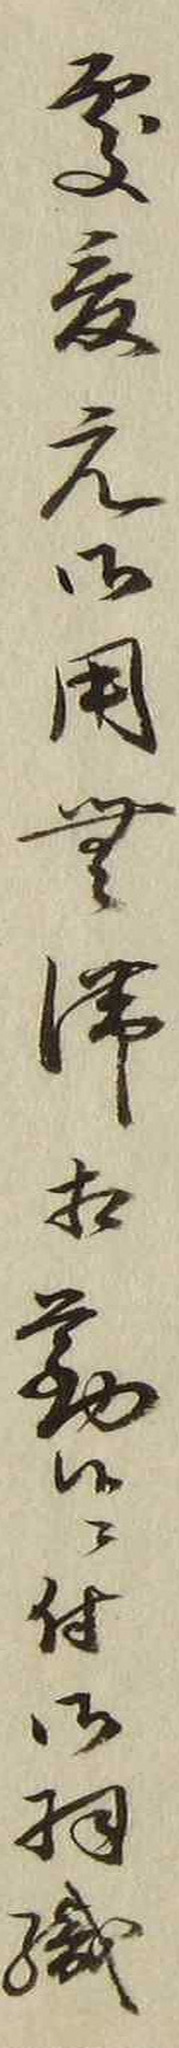処爰元御用無滞相勤候に付御羽織
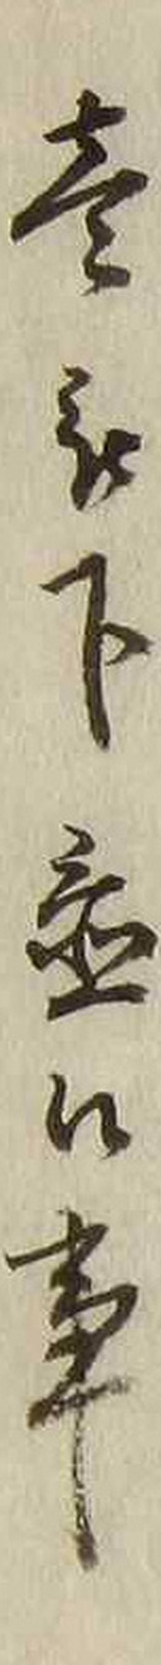壱被下置候事
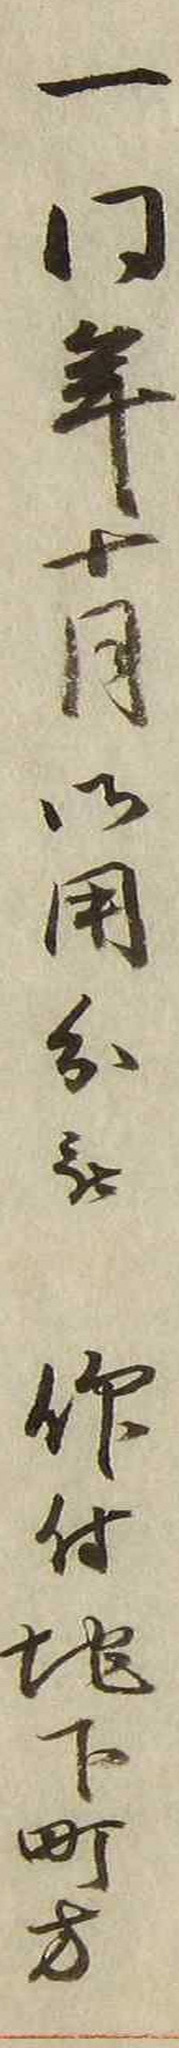一同年十月御用分被仰付地下町方

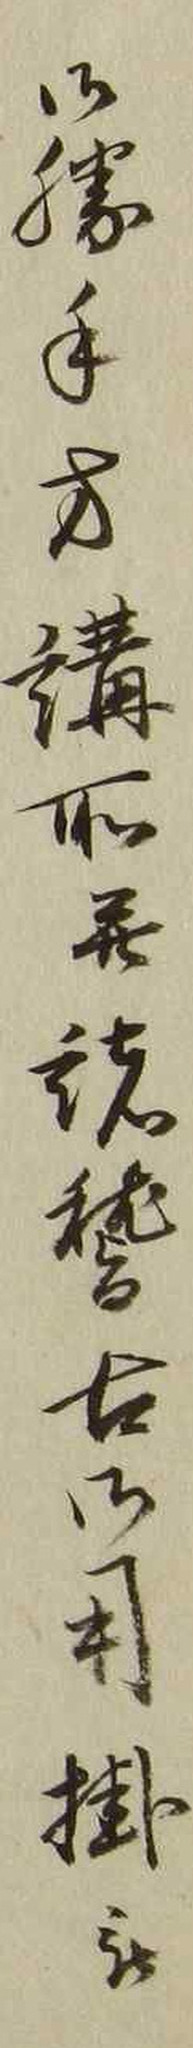御勝手方講所并諸稽古御用懸被
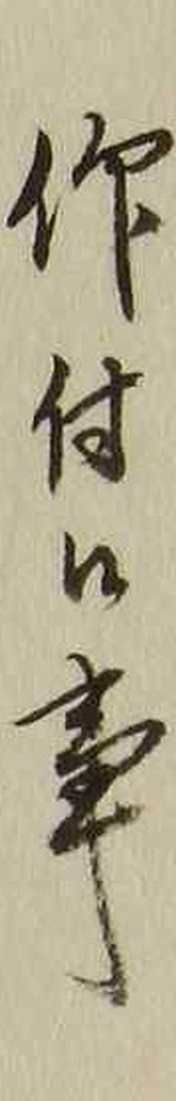仰付候事
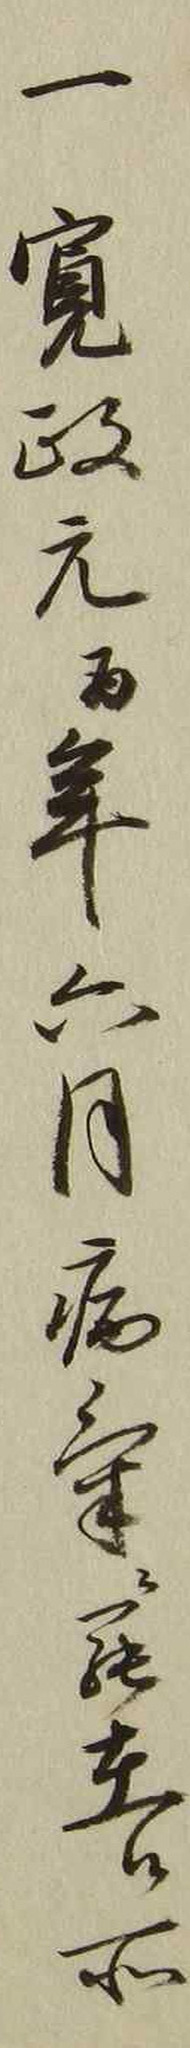一寛政元酉年六月病気罷在候所
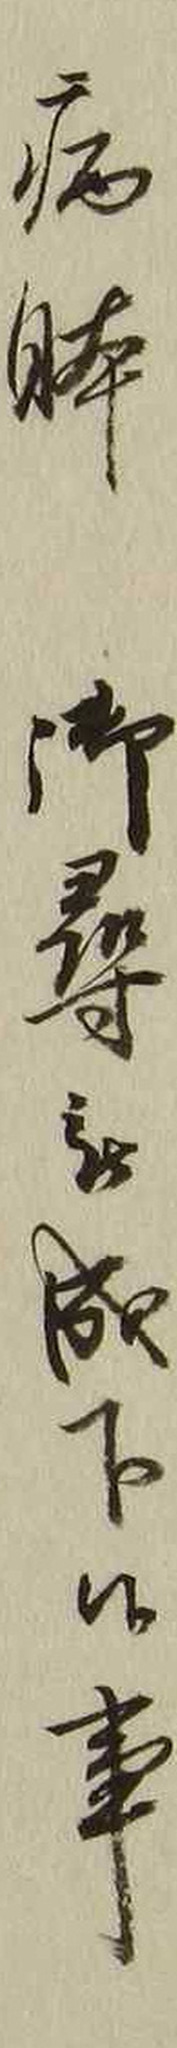病体御尋被成下候事
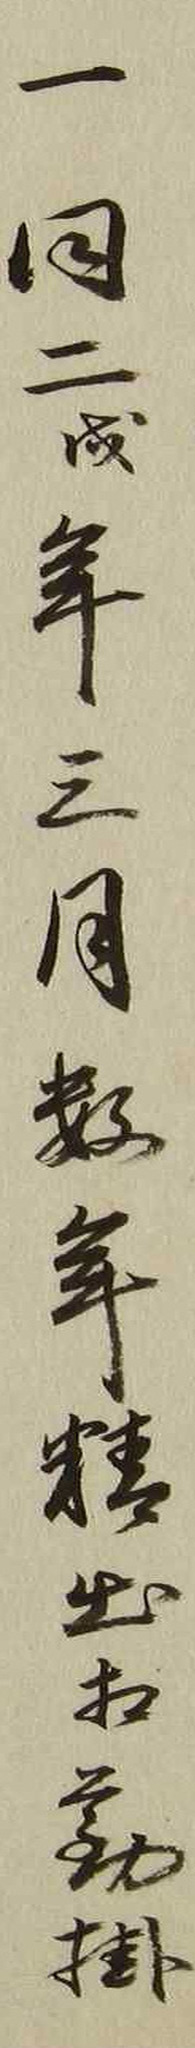一同二戌年三月数年精出相勤掛
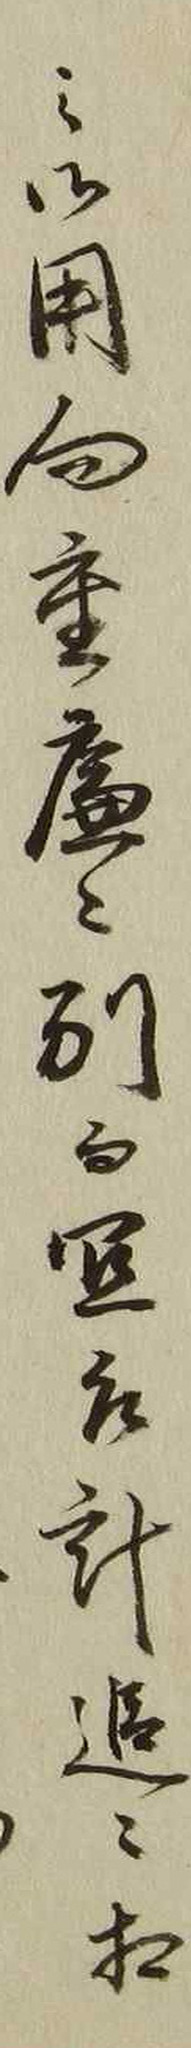之御用向重廉と別而宜計追々相
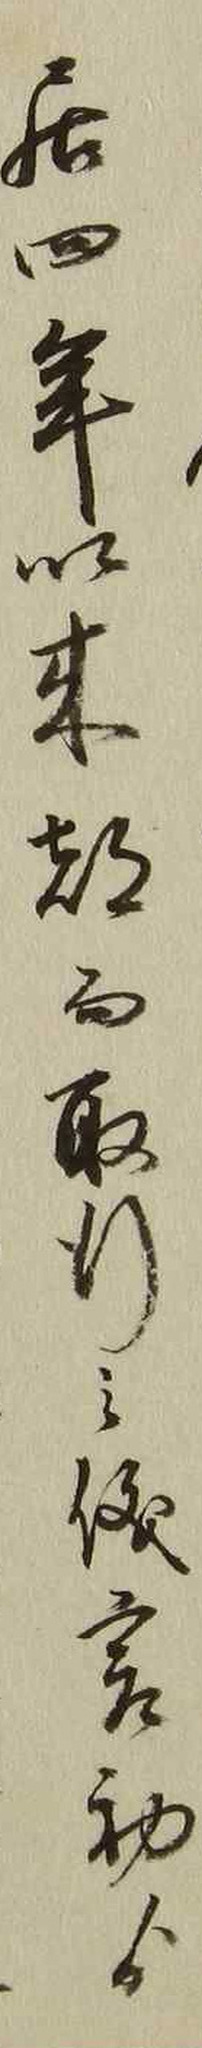居四年以来都而取行之儀最初ゟ
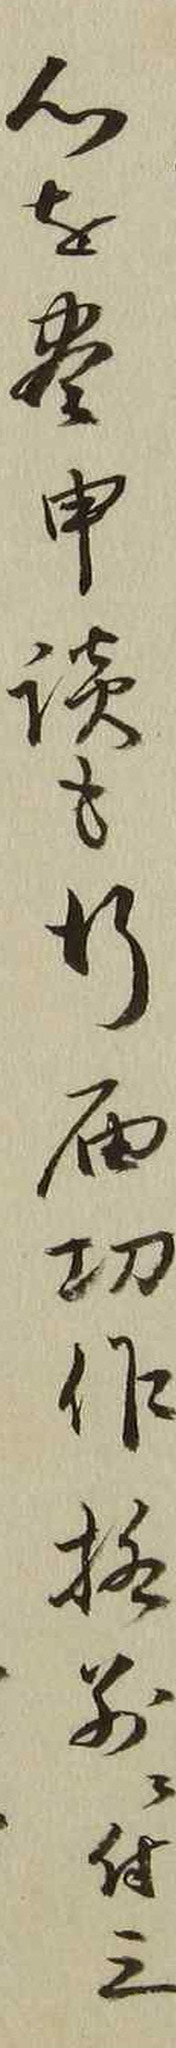心を尽申談も行届功作格別に付三
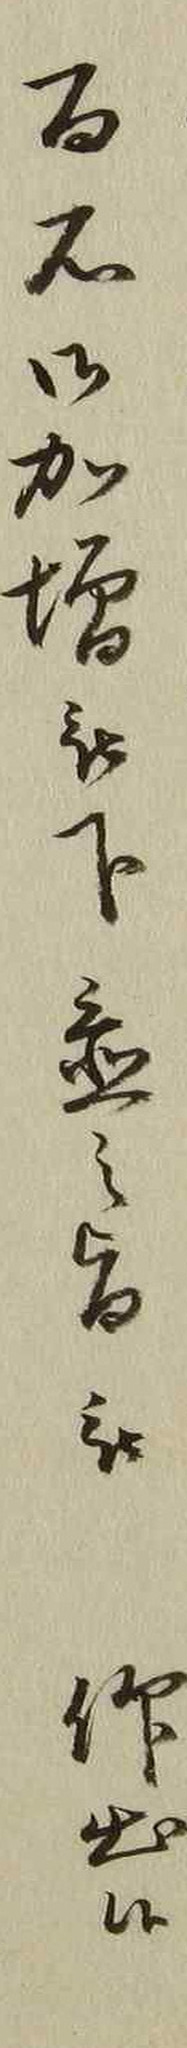百石御加増被下置之旨被仰出候
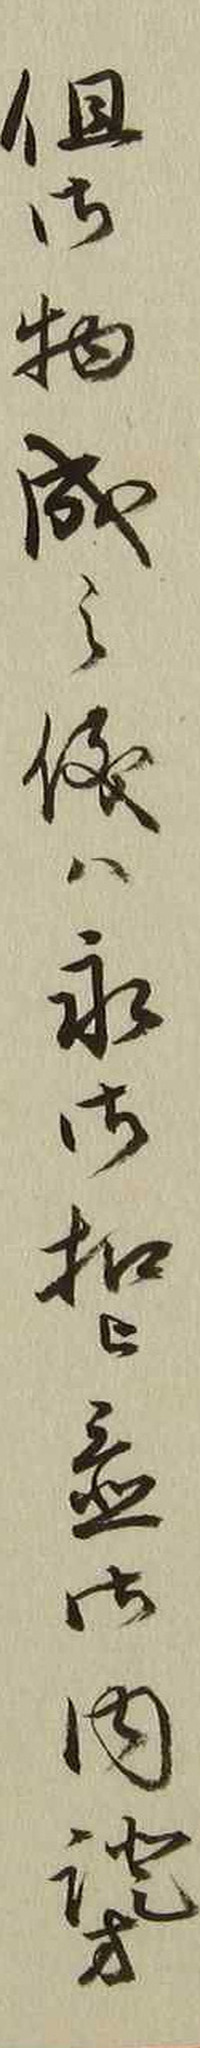但御物成之儀は永被扣置御内証方
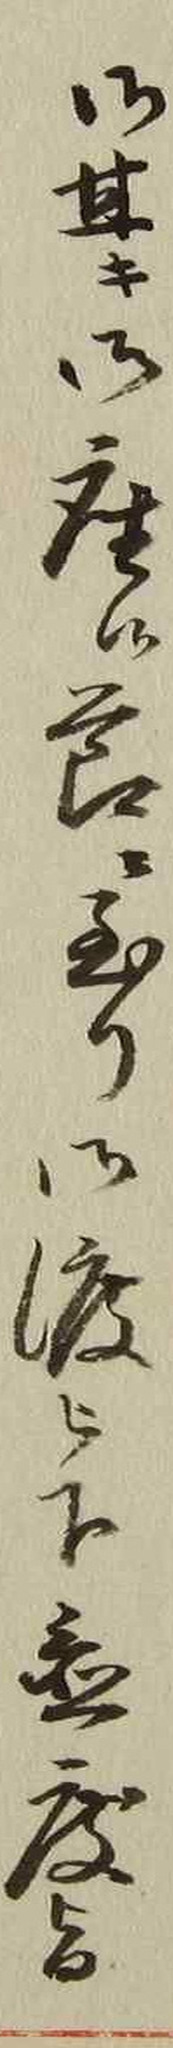御聞キ御座候節に至り御渡被下置度旨
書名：諸士系譜　巻之125　た之部1
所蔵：会津若松市立会津図書館
